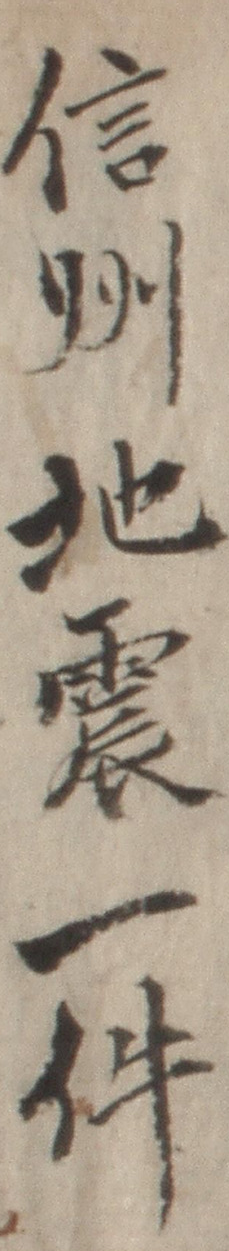信州地震一件

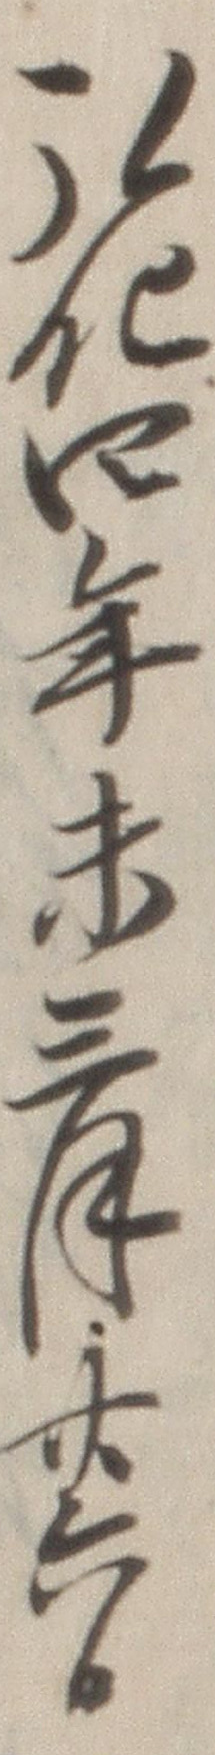弘化四年未三月廿六日
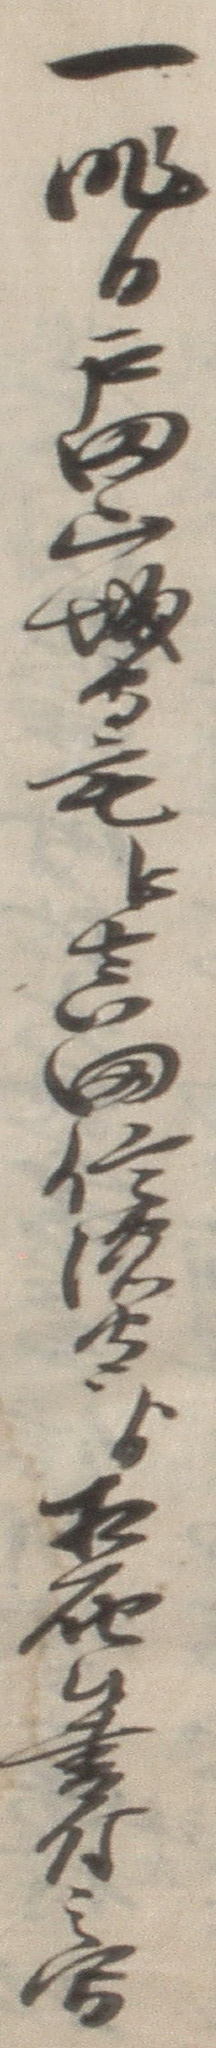一昨日戸田山城守宅江真田信濃守ゟ相届候書付之写
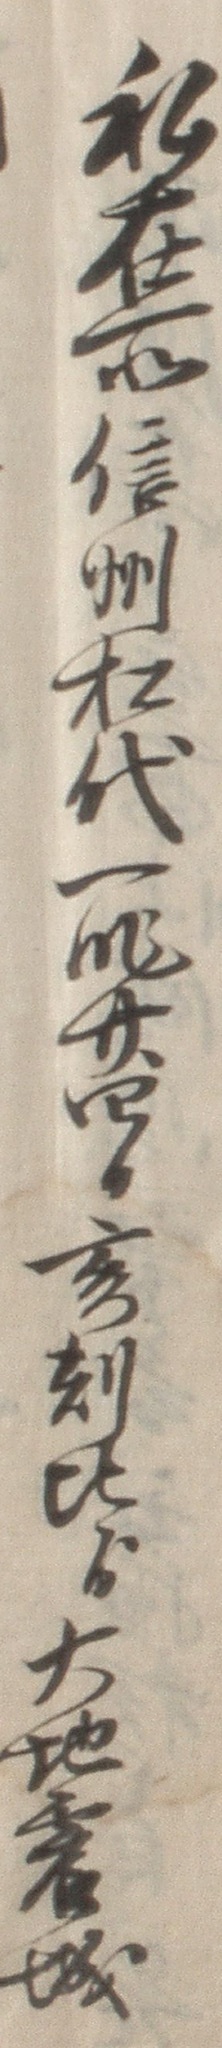私在所信州松代一昨廿四日亥刻比ゟ大地震城
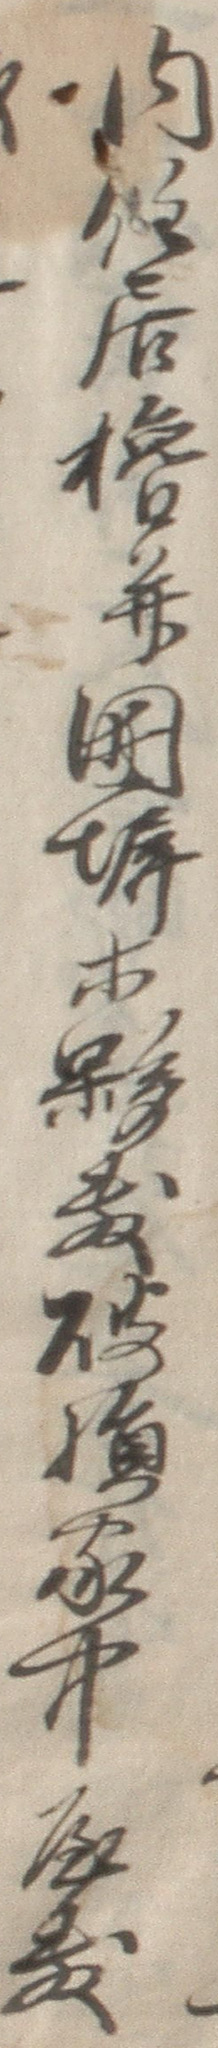内住居櫓并囲塀等夥敷破損家中屋敷
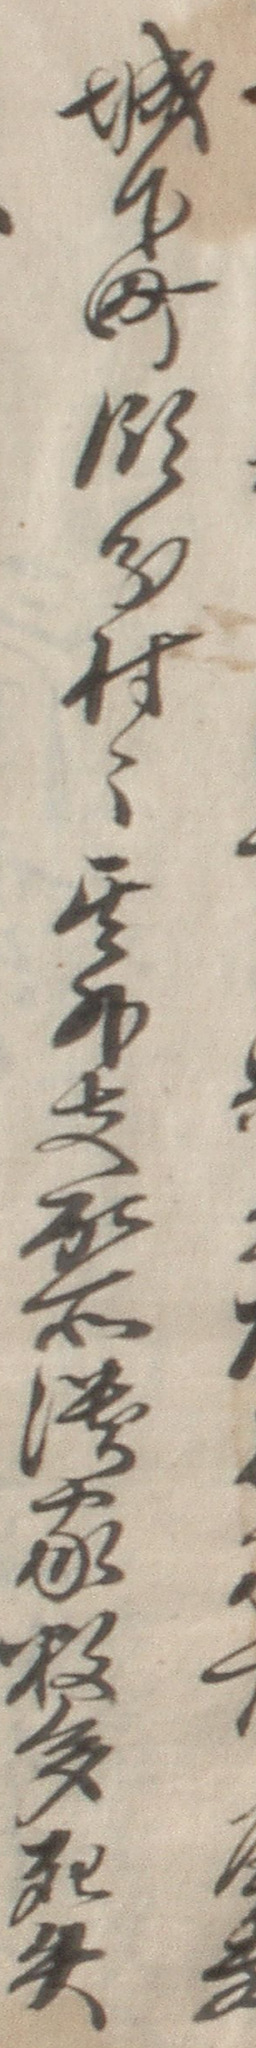城下町領分村々其外支配所潰家数多死失
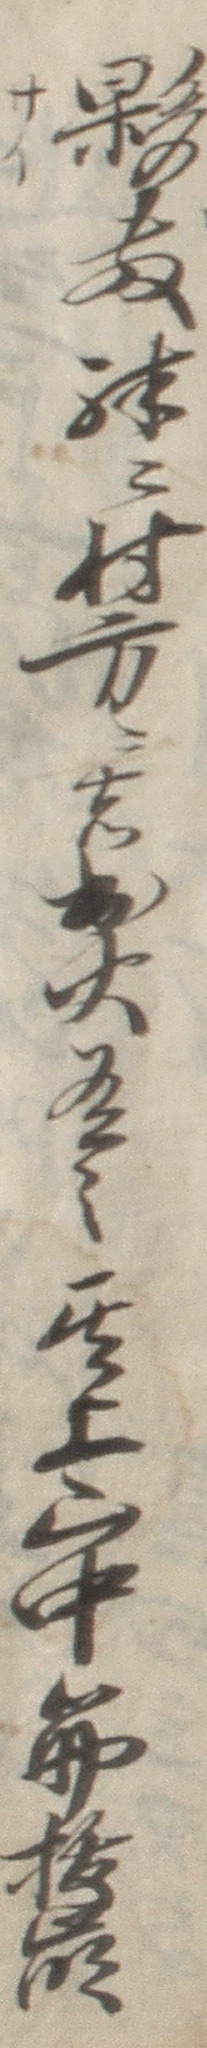夥敷殊二村方二は出火有之其上山中筋抜崩
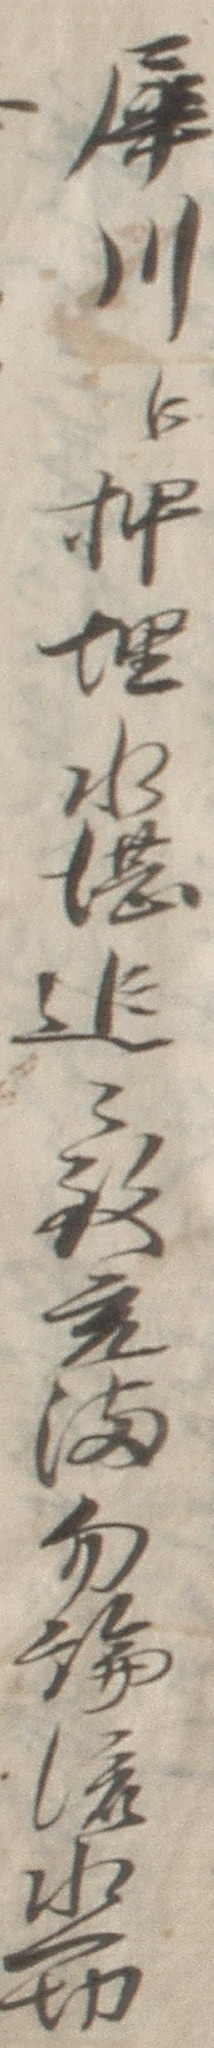犀川江押埋水湛追々致充満勿論流水一切
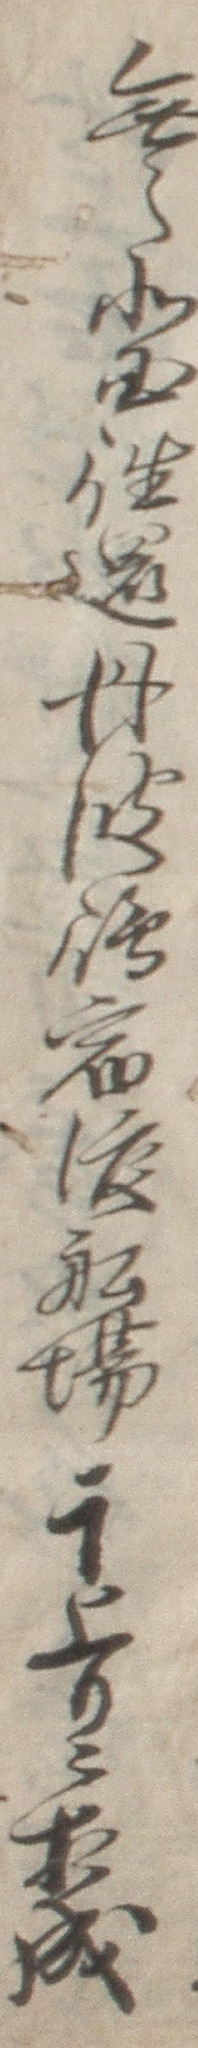無之北国往還丹波嶋宿渡船場干上り二相成

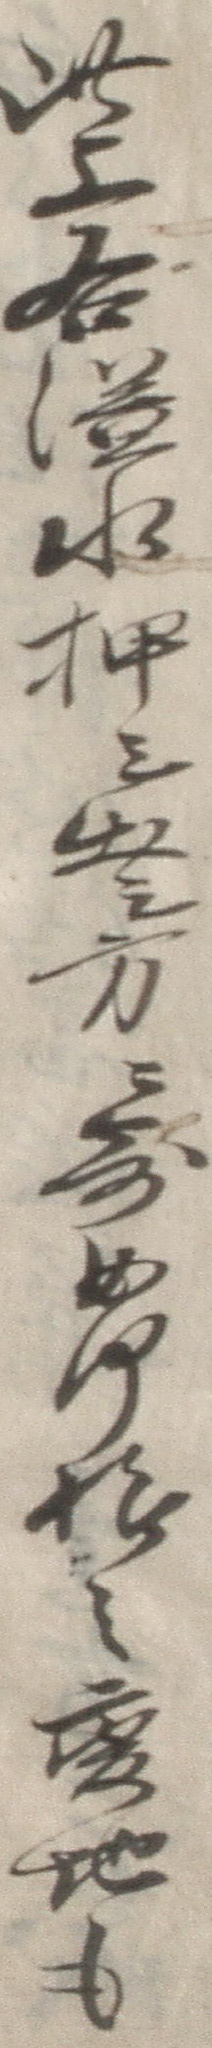此上右溢水押ㇱ出ㇱ方二寄如何様之変地も
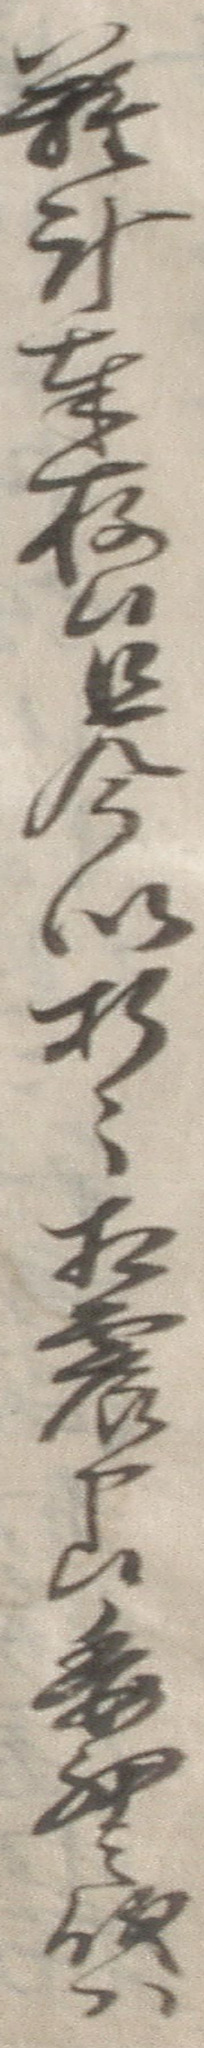難計奉存候且今以折々相震申候委細之儀ハ
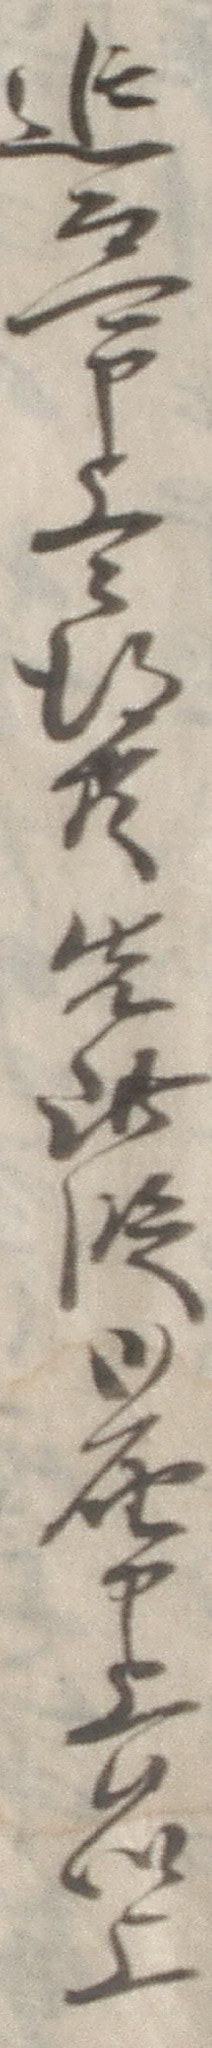追而可申上候得共先此段御届申上候以上
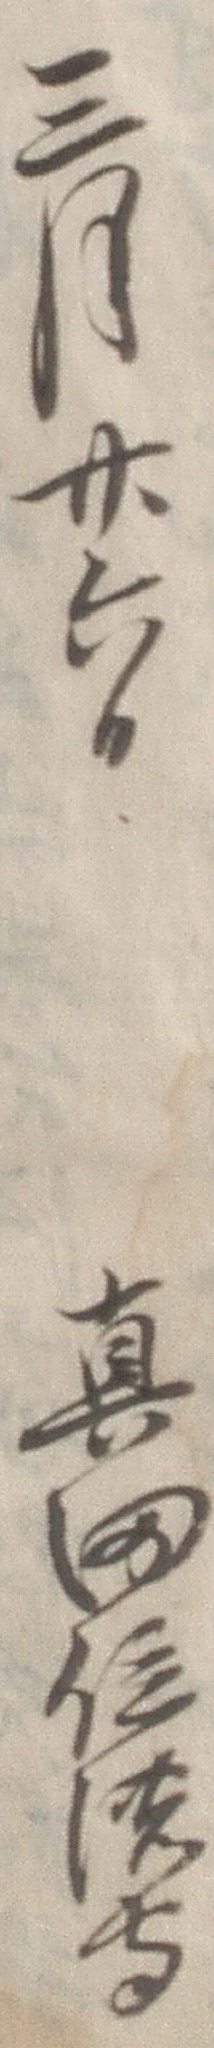三月廿六日真田信濃守
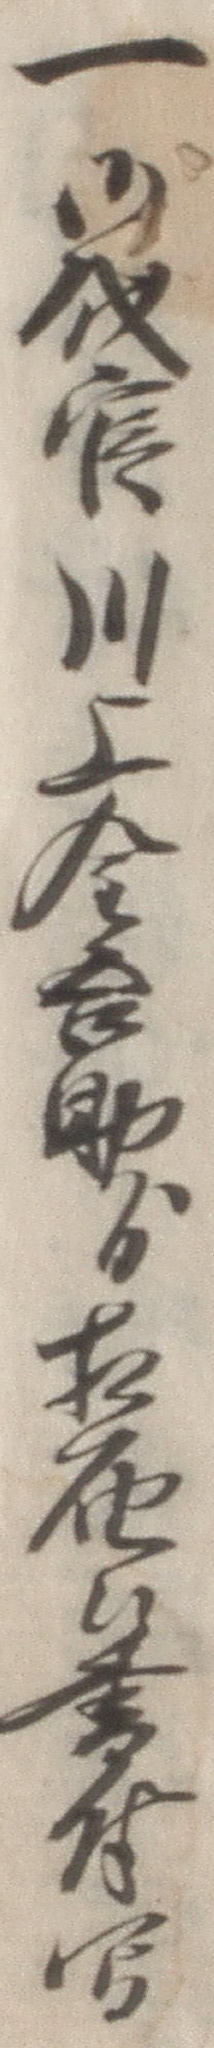一御代官川上金吾助ゟ相届候書付写
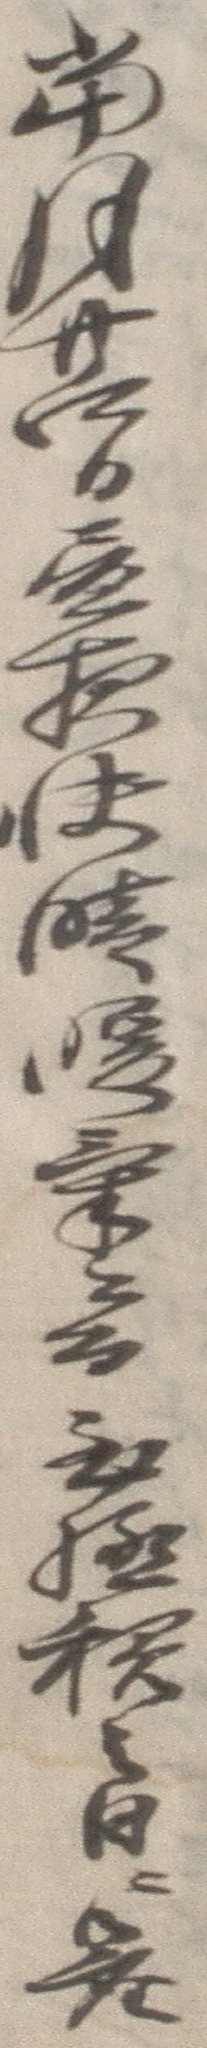当月廿四日昼夜快晴暖気二而至極穏之日二御座
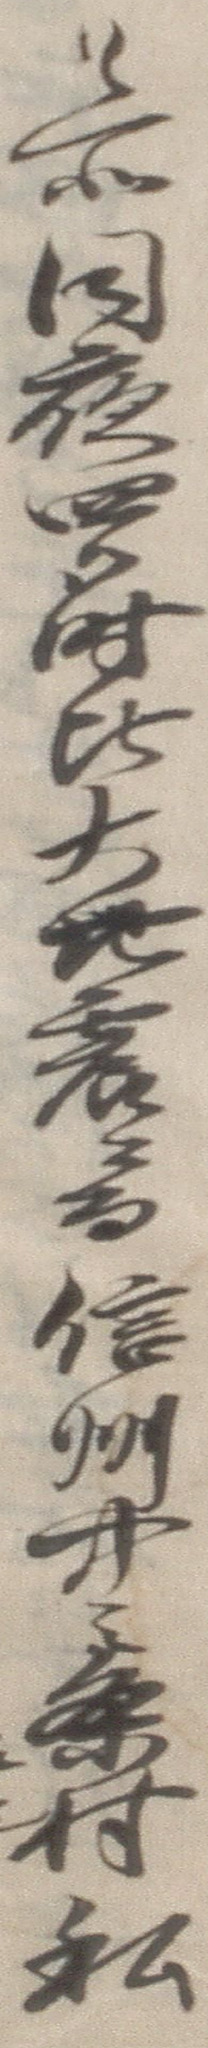候所同夜四ッ時比大地震二而信州中之条村私
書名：信州地震一件
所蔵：東京大学地震研究所図書室 Earthquake Research Institute Library, The University of Tokyo, JAPAN
